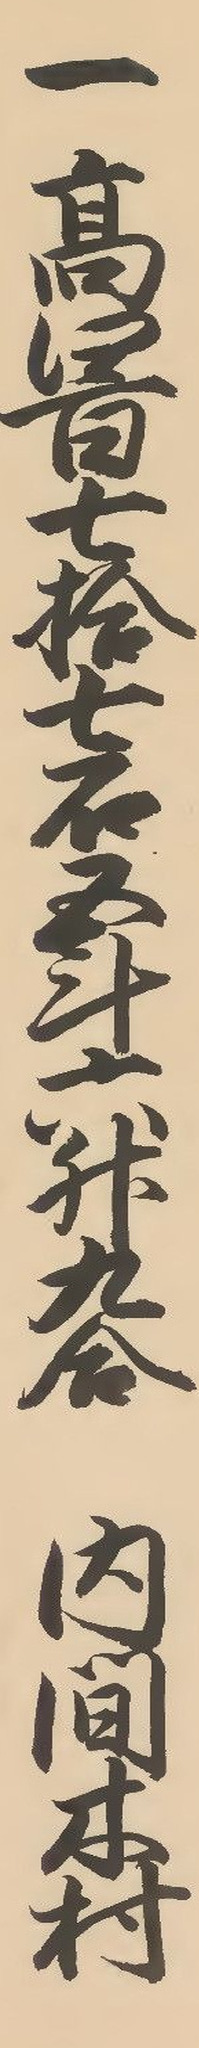一高四百七拾七石五斗六升九合内間木村
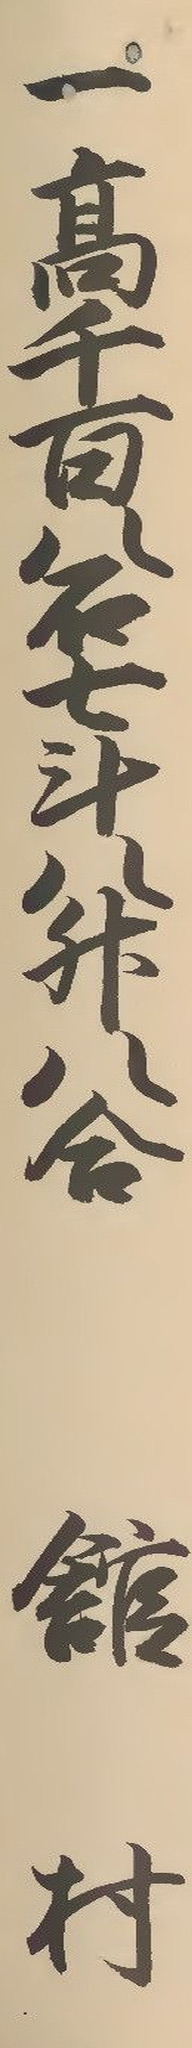一高千百八石七斗八升八合館村
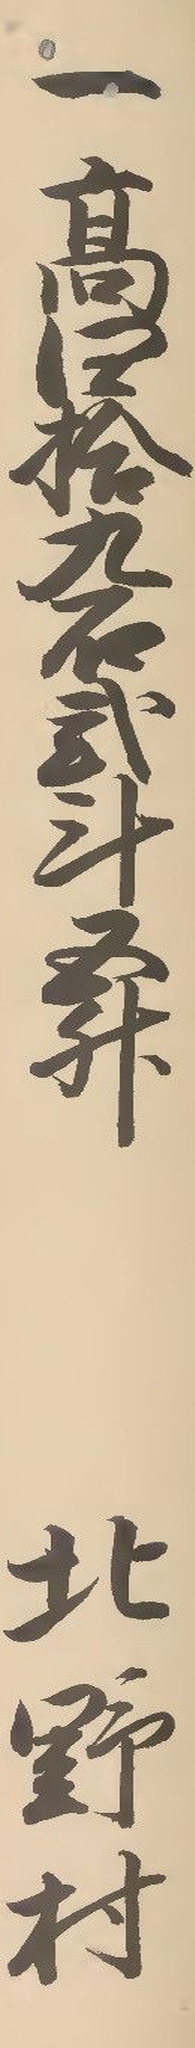一高四拾九石弐斗五升北野村
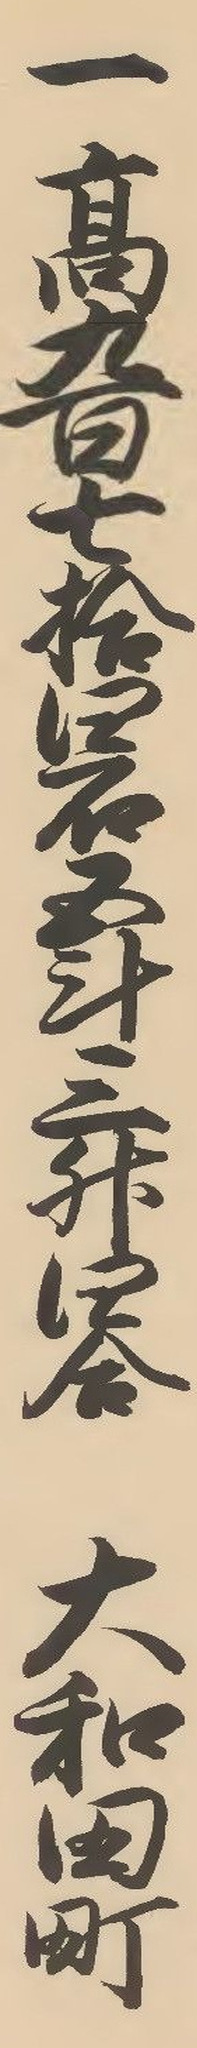一高九百七拾四石五斗三升四合大和田町
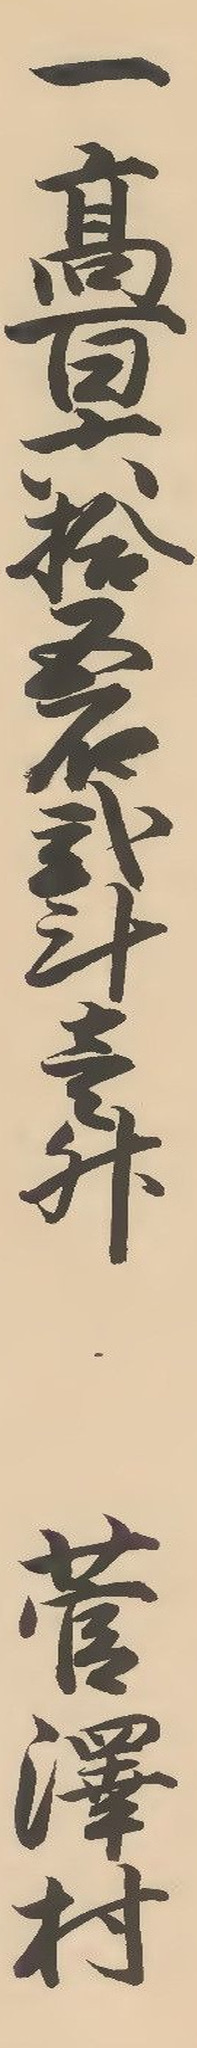一高百六拾五石弐斗壱升菅澤村
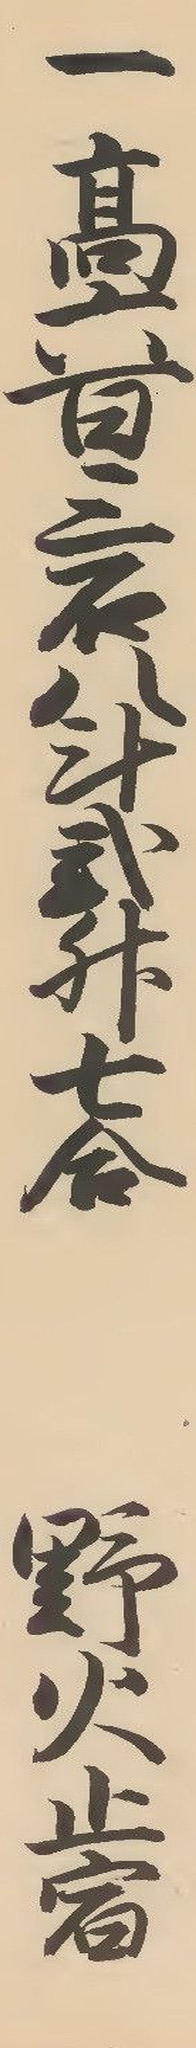一高六百三石八斗弐升七合野火止宿

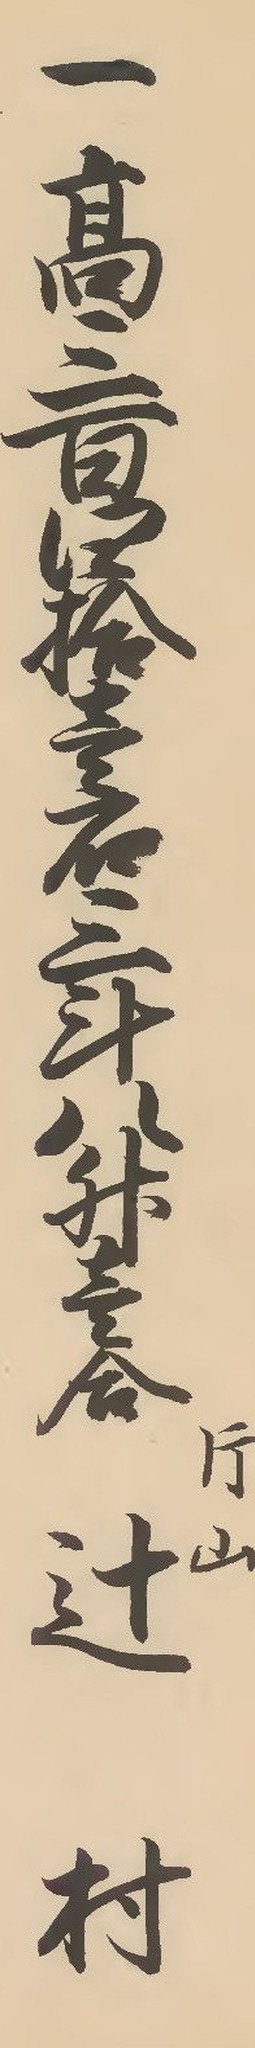一高三百四拾壱石三斗八升壱合辻村
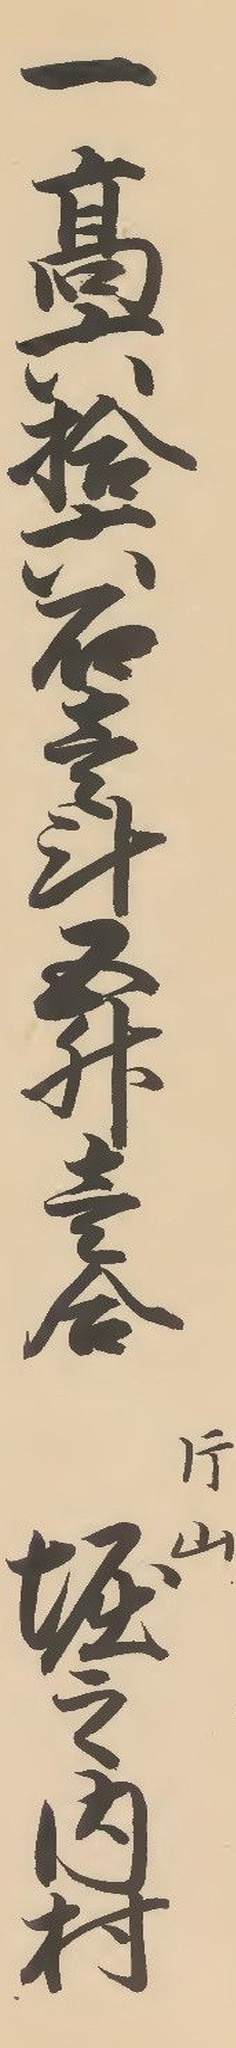一高六拾六石壱斗五升壱合堀之内村
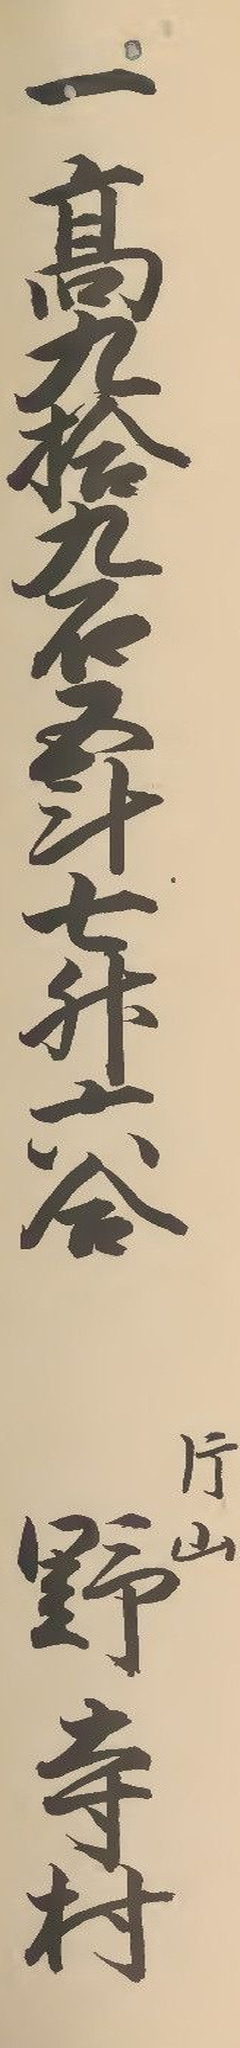一高九拾九石五斗七升六合野寺村
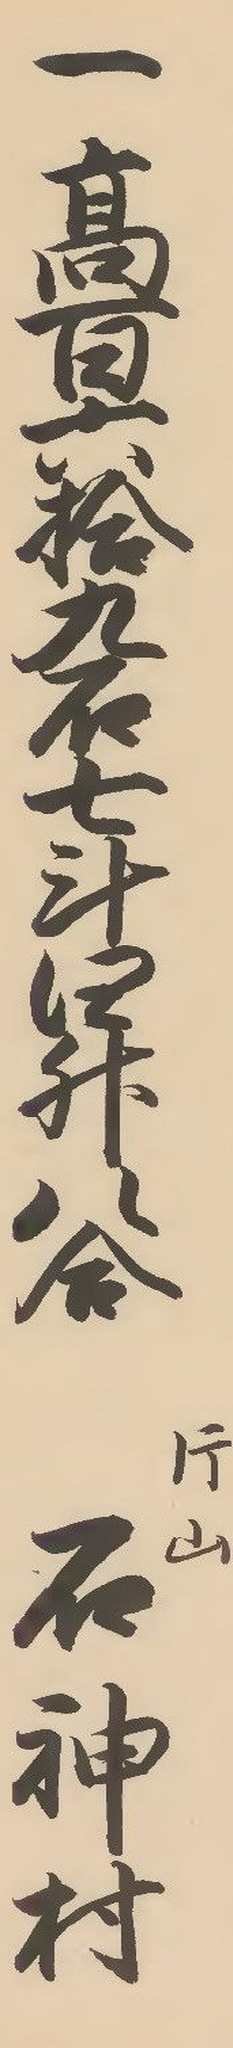一高百六拾九石七斗四升八合石神村

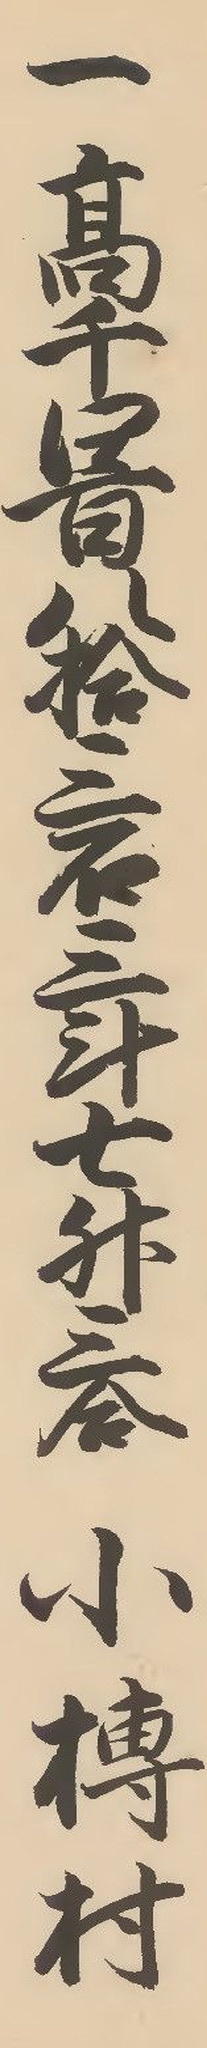一高千四百八拾三石三斗七升三合小榑村
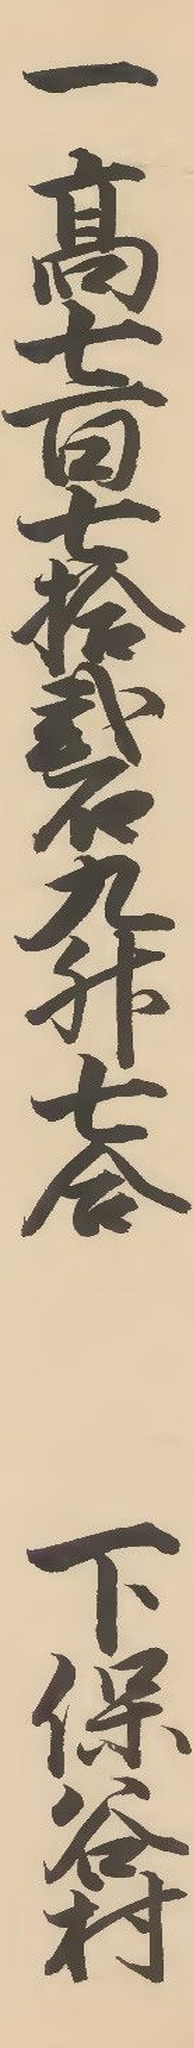一高七百七拾弐石九升七合下保谷村
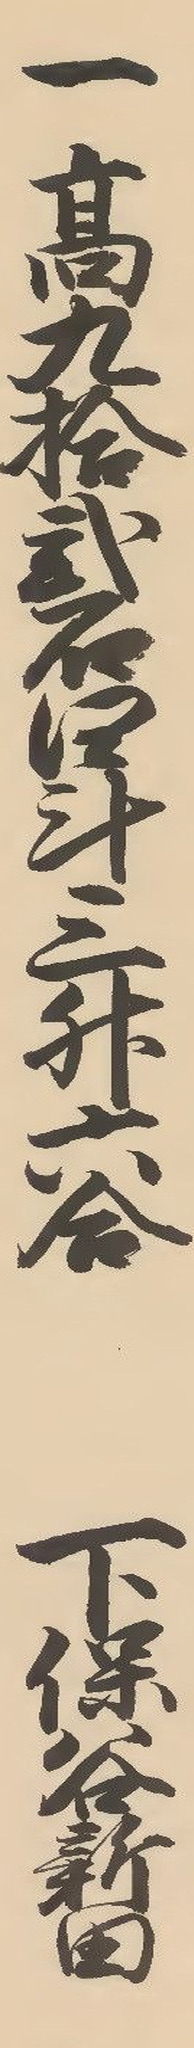一高九拾弐石四斗三升六合下保谷新田
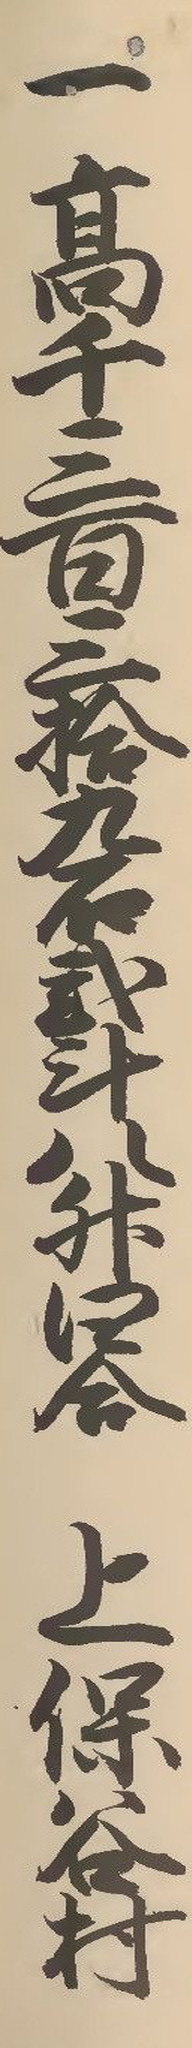一高千三百三拾九石弐斗八升四合上保谷村
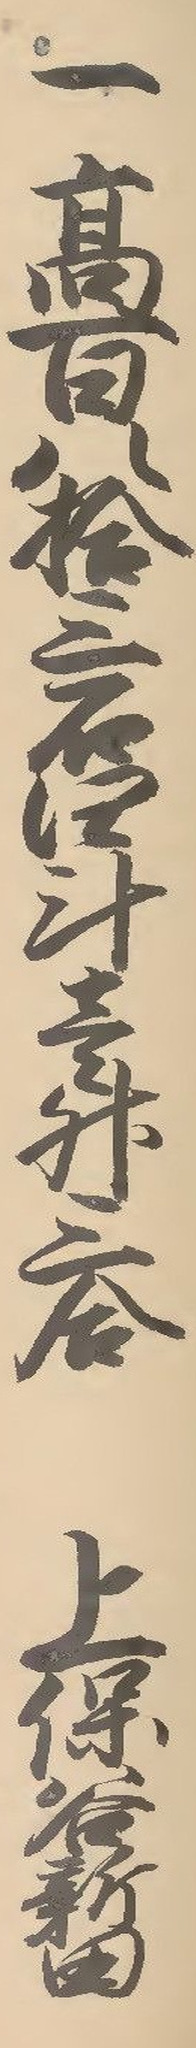一高百八拾三石四斗壱升三合上保谷新田
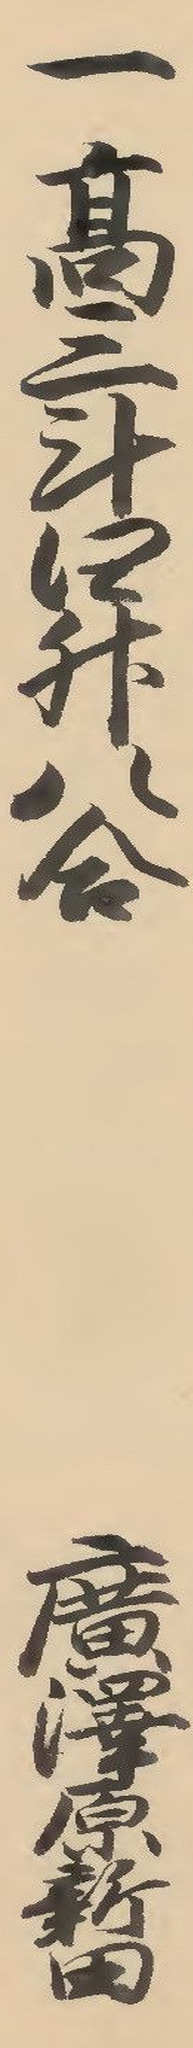一高三斗四升八合広澤原新田
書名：武蔵国郷帳　上
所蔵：国立公文書館 National Archives of Japan
